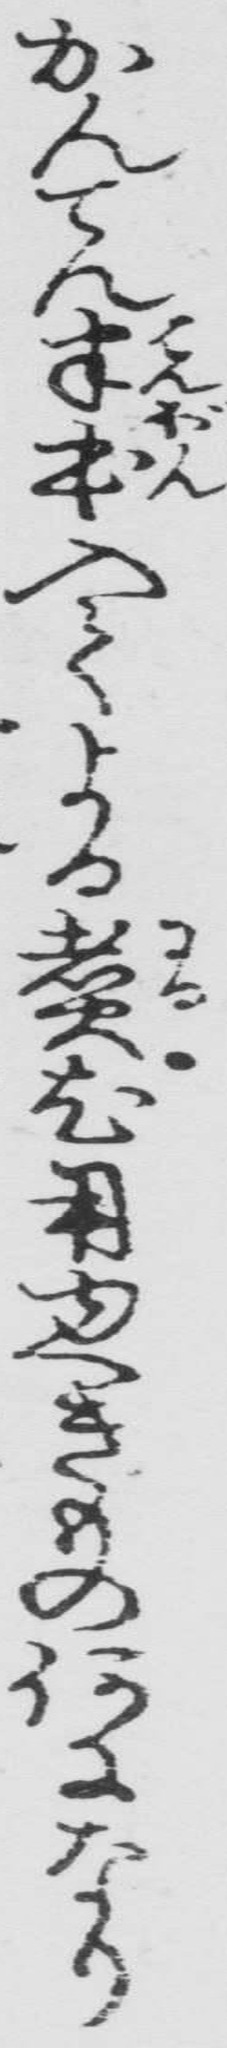かんてん半本入てよる煮、尤用ゆへきもの何になり
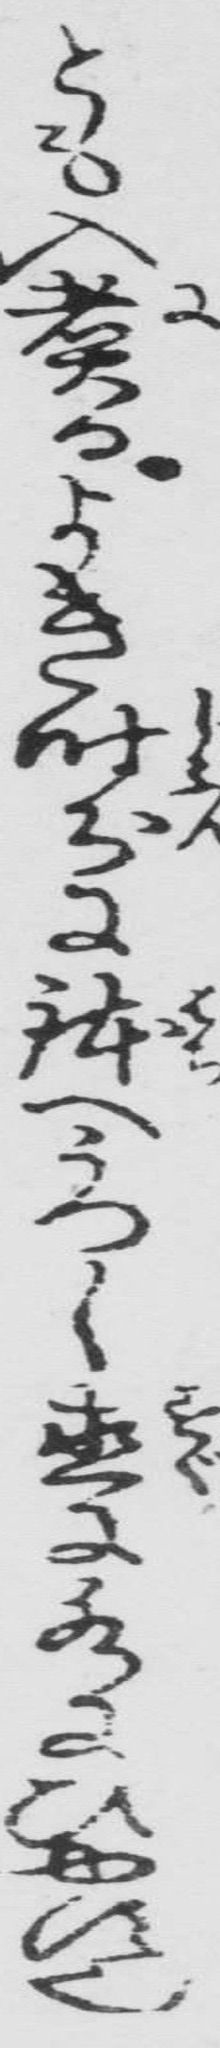とも入煮る。よき時分に鉢へうつし直に水にひやす也
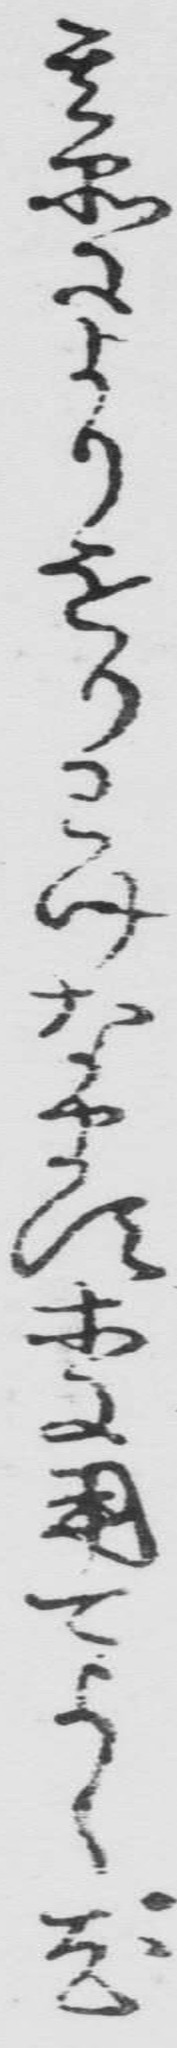其品によりを？りわけなます等に用てよし、尤
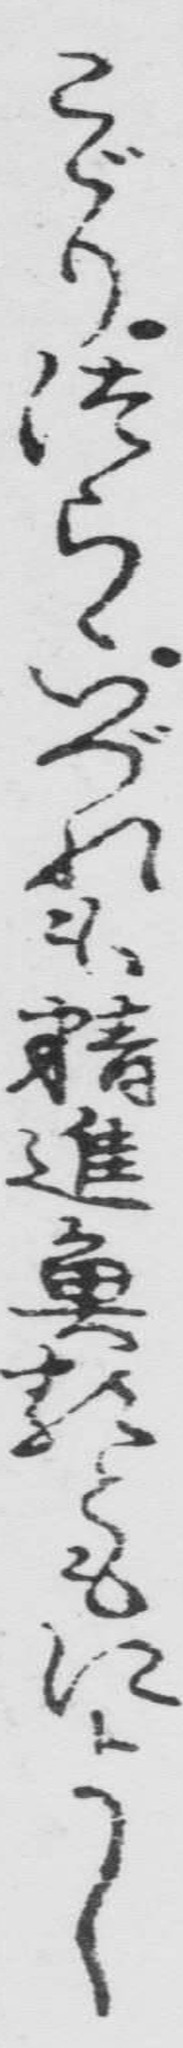こゞり、つらゝ、いづれも精進魚類ともによし
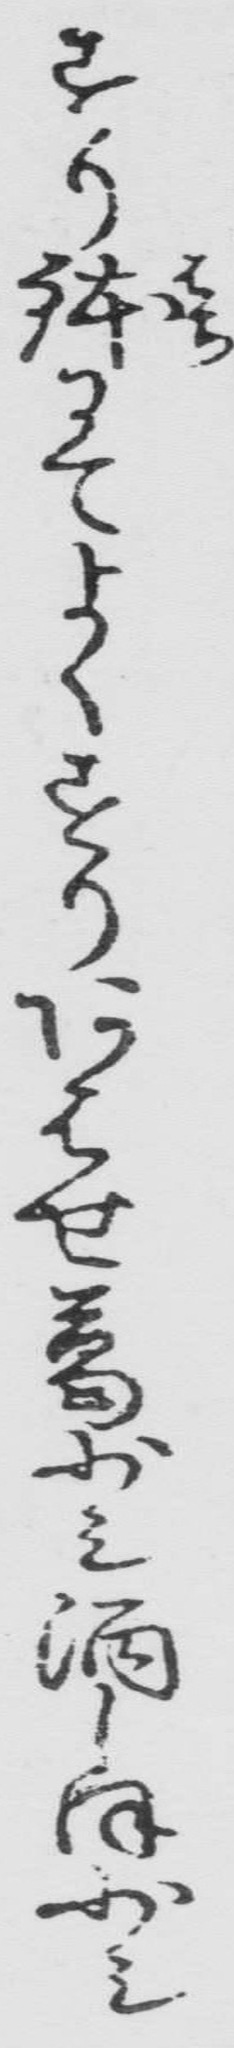すり鉢にてよくすりあはせ葛少し酒しほ少し
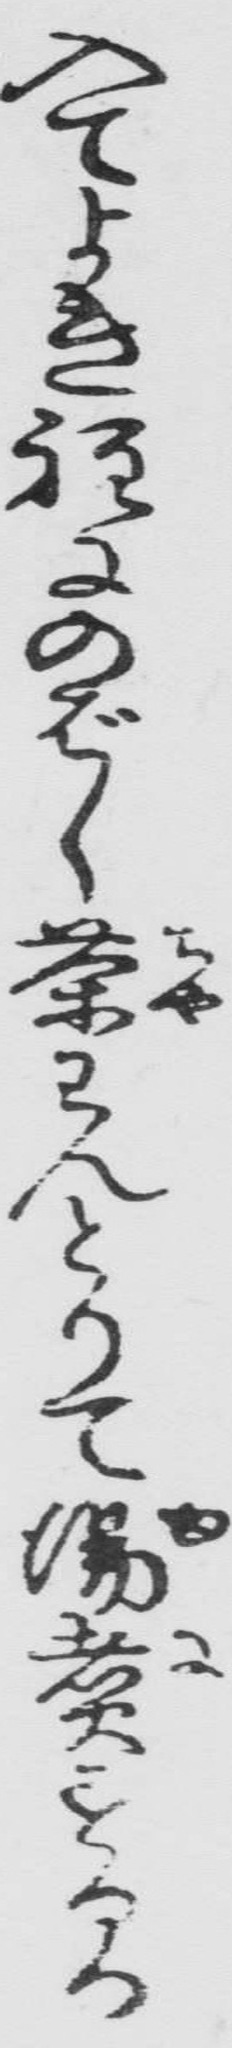入てよき程にのばし茶わんとりて湯煮するか
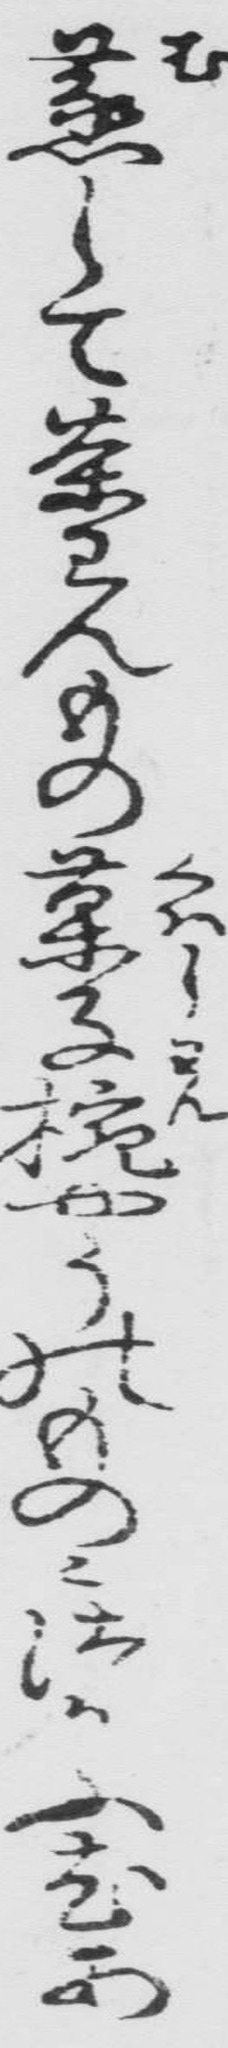蒸して茶わんもの菓子椀やうのものにつかふ尤あ
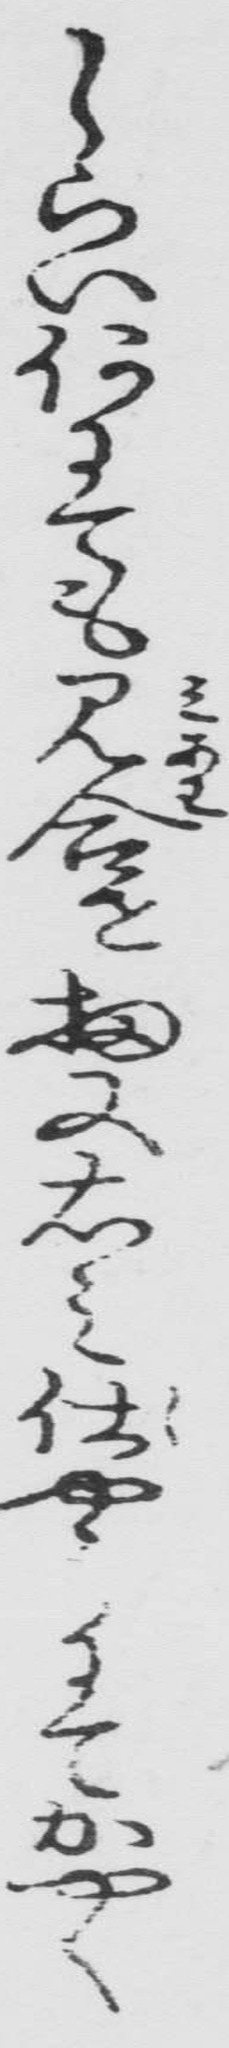しらい何にても見合せ扨又右之仕やうにてかやく
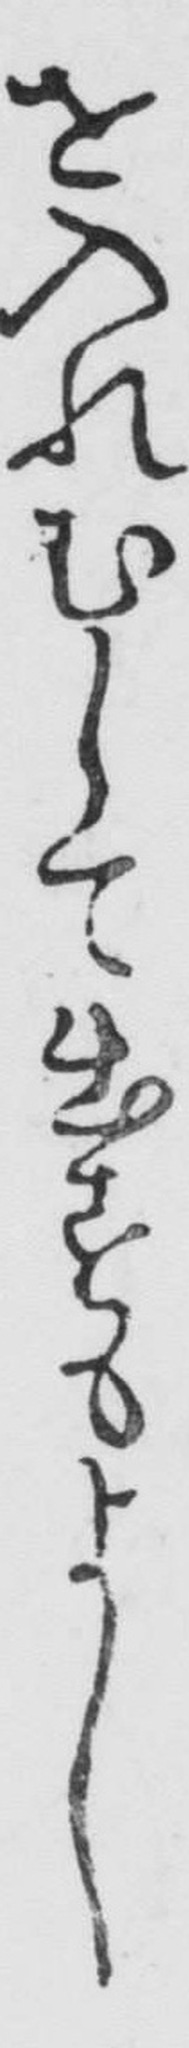を入れむして出すもよし

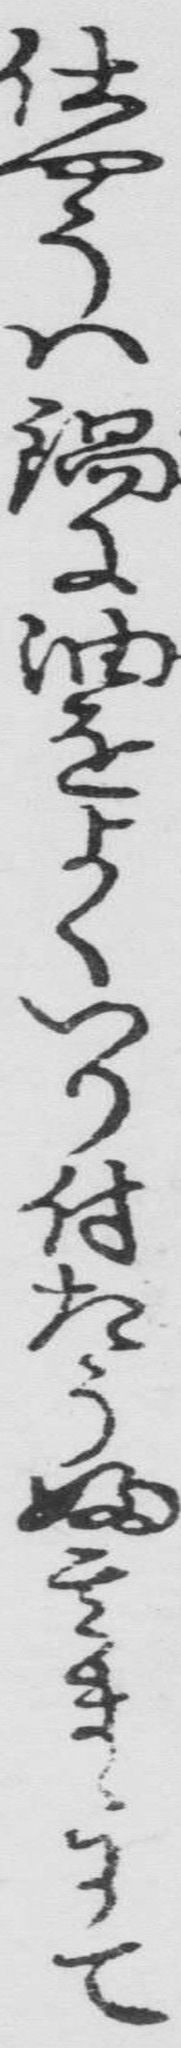仕やうは鍋に油をよくいり付たうふ其まゝにて
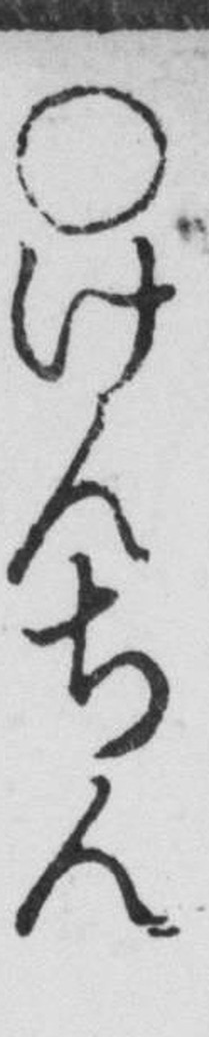○けんちん
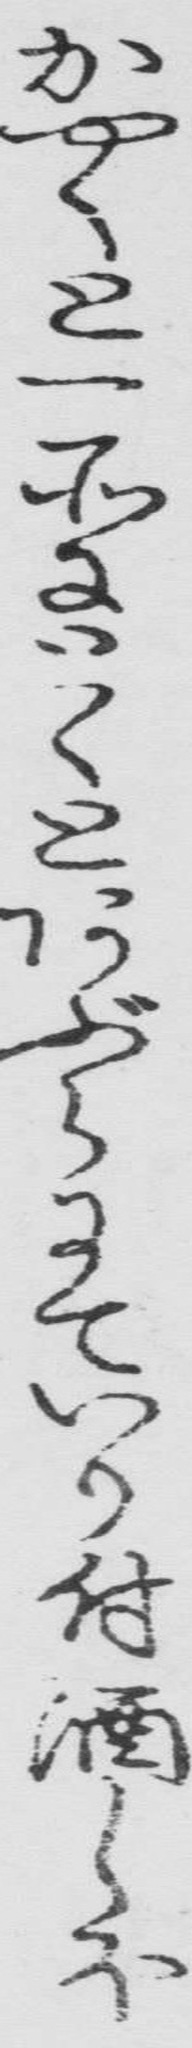やくと一所にとくとあぶらにていり付酒しほ
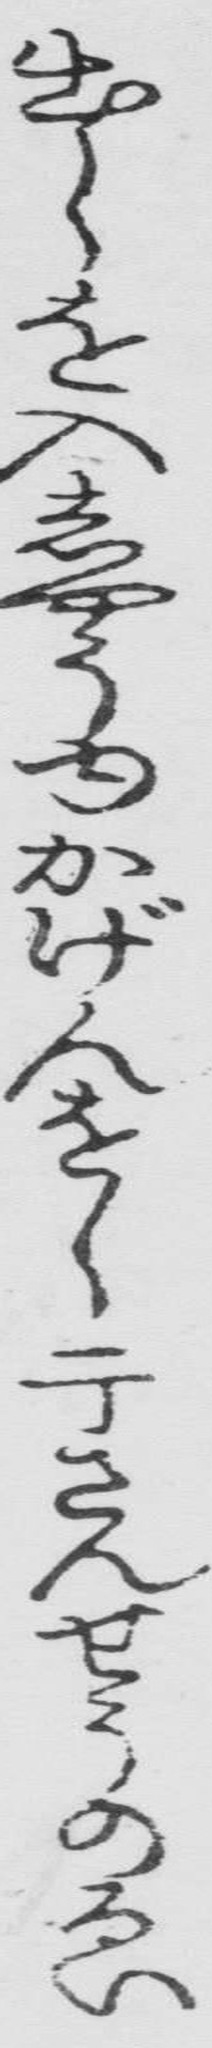出しを入しやうゆかげんをし干さんせうのるい
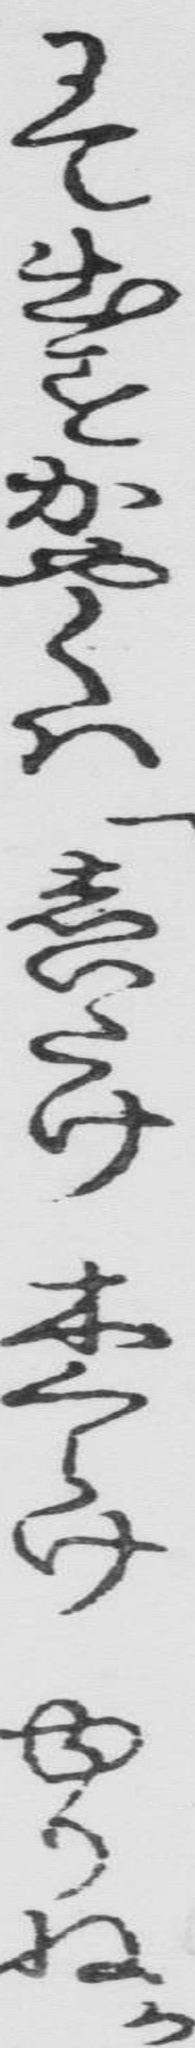にて出すかやくは〽しいたけ木くらけゆりねか
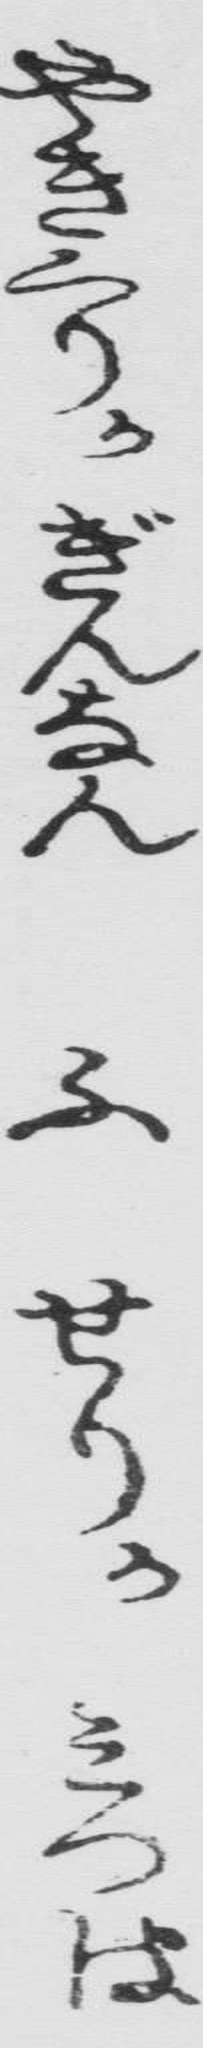やきくりかぎんなんふせりかみつは
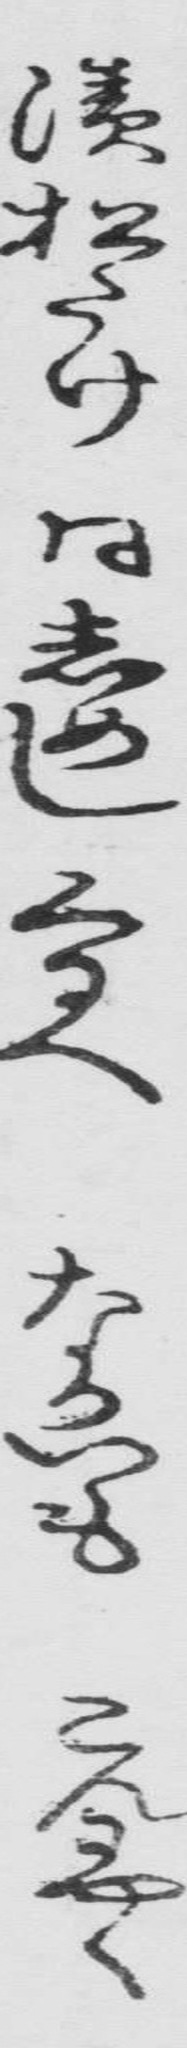漬松たけ同しめしくわへなかいもこんにやく
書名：諸家通用/即席料理
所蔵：大阪府立大学学術情報センター 国文学研究資料館
